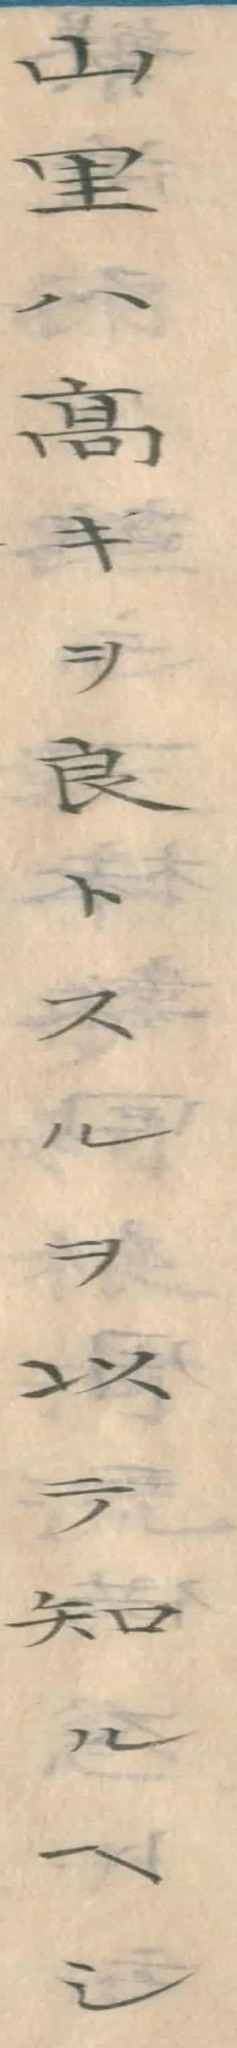山里ハ高キヲ良トスルヲ以テ知ルヘシ
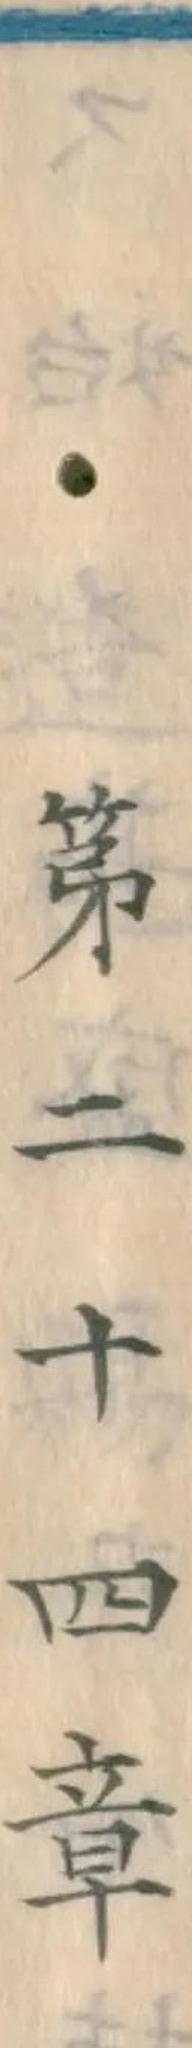第二十四章
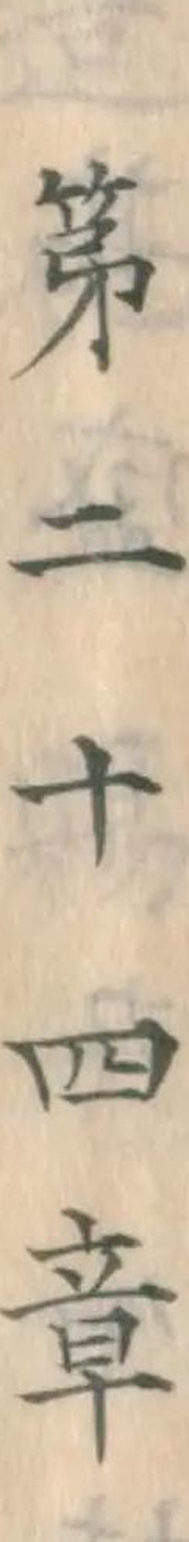第二十四章
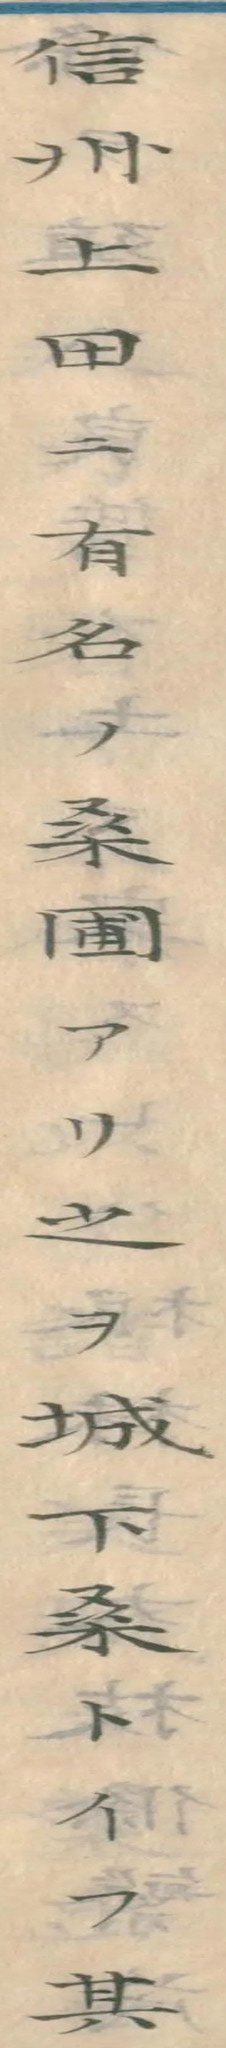信州上田ニ有名ノ桑圃アリ之ヲ城下桑トイフ其
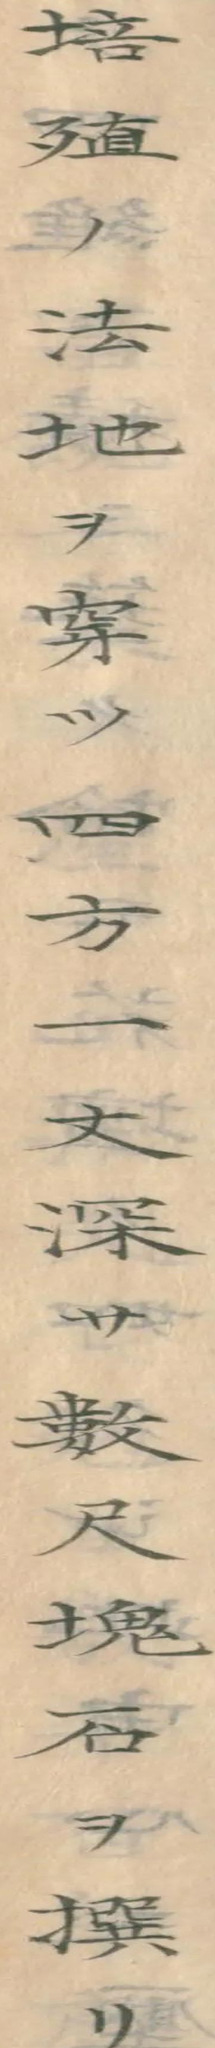培殖ノ法地ヲ穿ツ四方一丈深サ数尺塊石ヲ撰リ

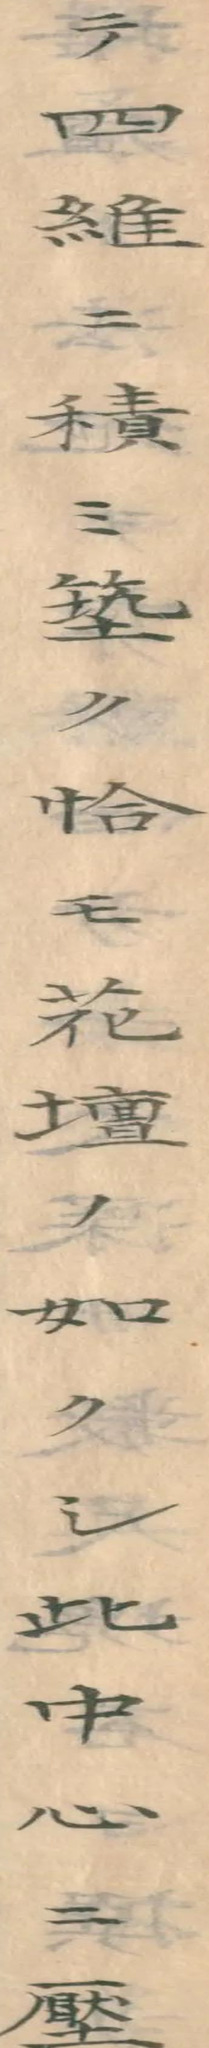テ四維ニ積ミ築ク恰モ花壇ノ如クシ此中心ニ圧
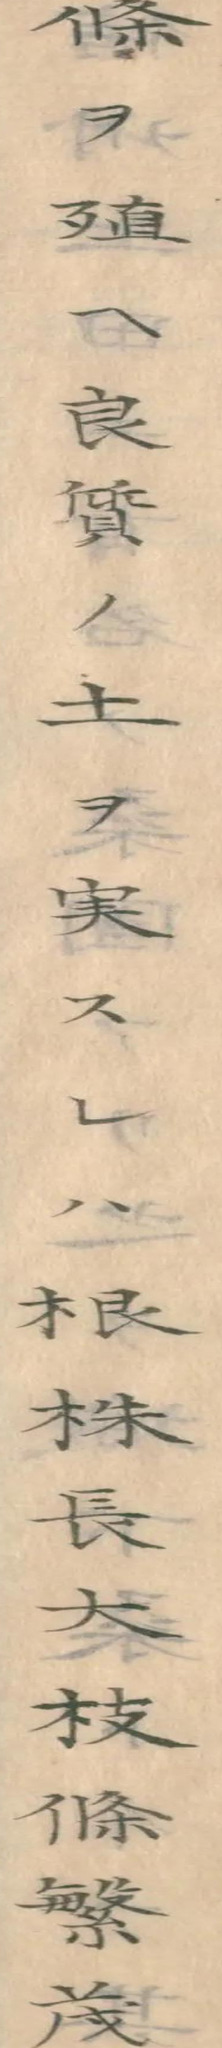条ヲ殖ヘ良質ノ土ヲ実スレハ根株長大枝条繁茂
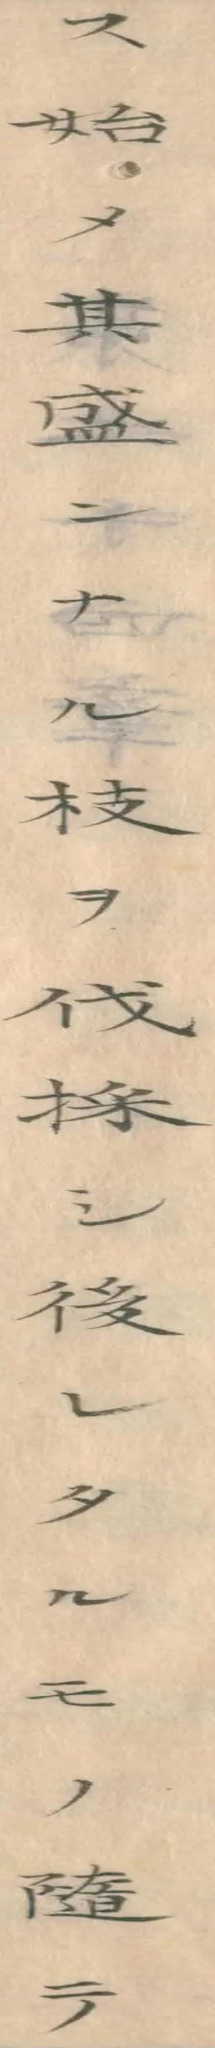ス始メ其盛ンナル枝ヲ伐採シ後レタルモノ随テ
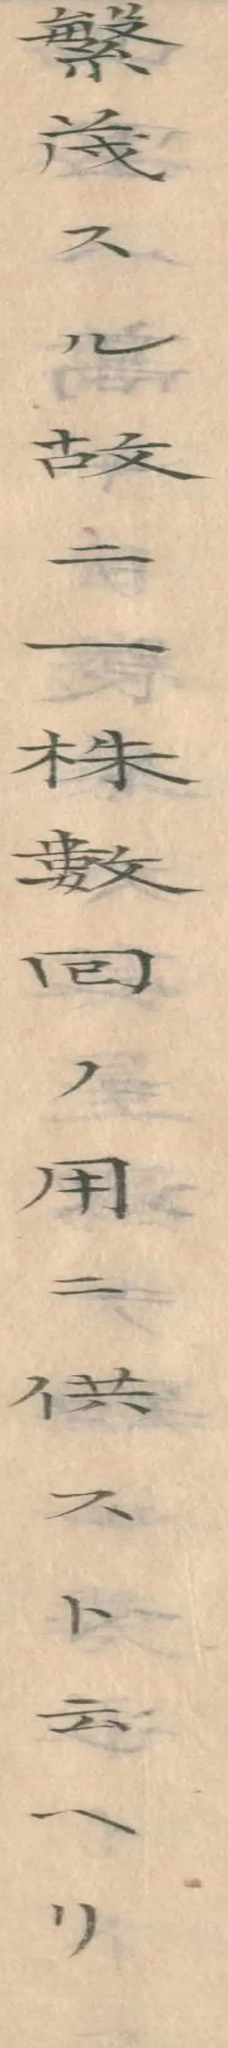繁茂スル故ニ一株数回ノ用ニ供スト云ヘリ
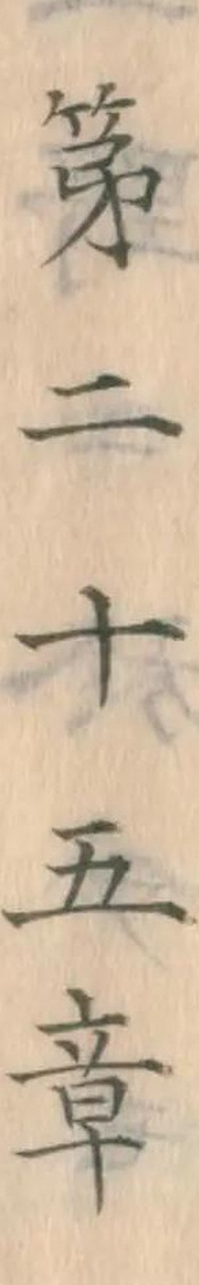第二十五章
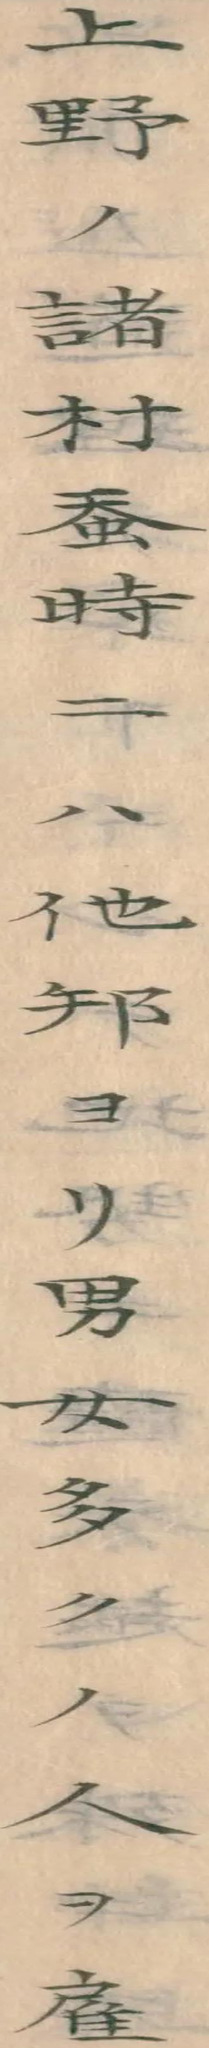上野ノ諸村蚕時ニハ他邦ヨリ男女多クノ人ヲ雇
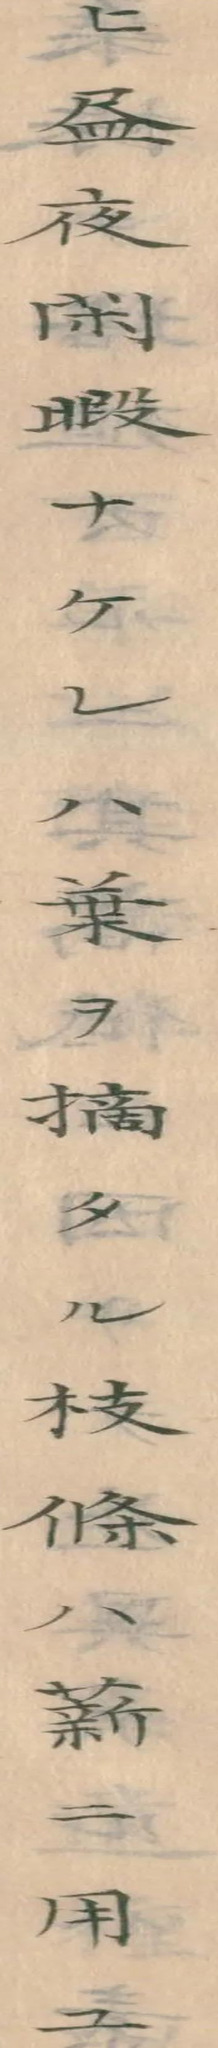ヒ昼夜閑暇ナケレハ葉ヲ摘タル枝条ハ薪ニ用ユ
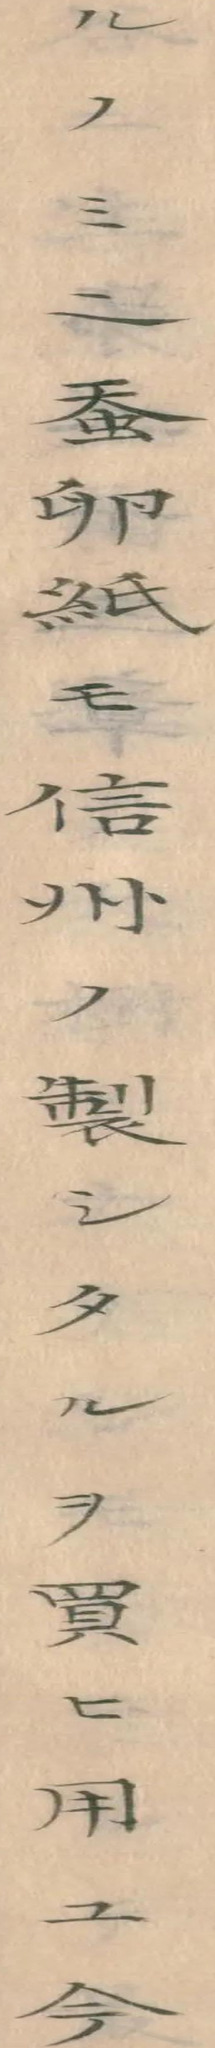ルノミ也蚕卵紙モ信州ノ製シタルヲ買ヒ用ユ今
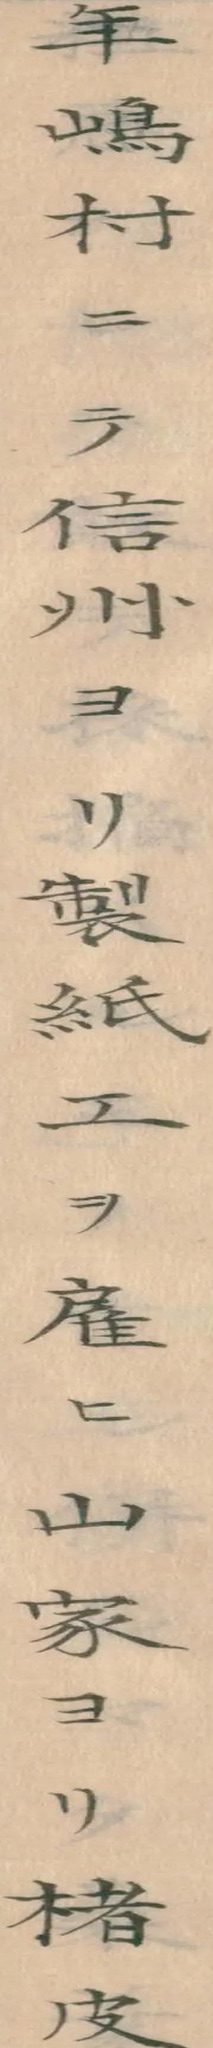年嶋村ニテ信州ヨリ製紙工ヲ雇ヒ山家ヨリ楮皮
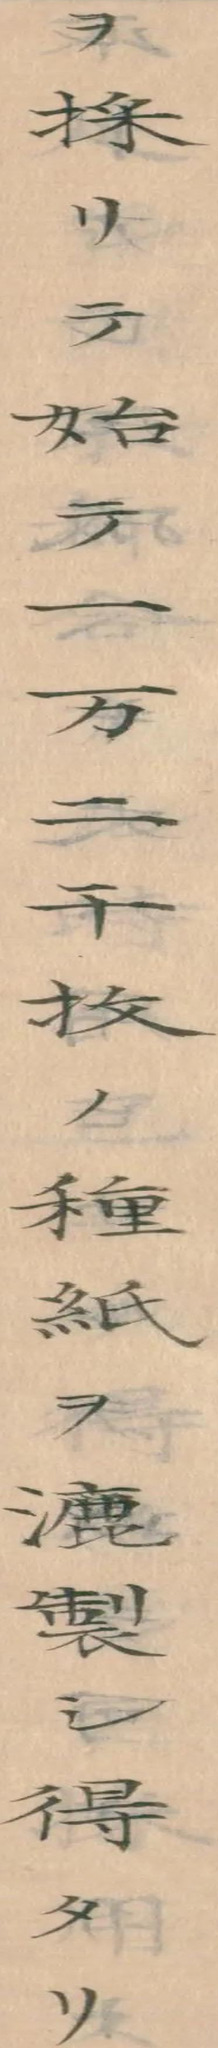ヲ採リテ始テ一万二千枚ノ種紙ヲ漉製シ得タリ
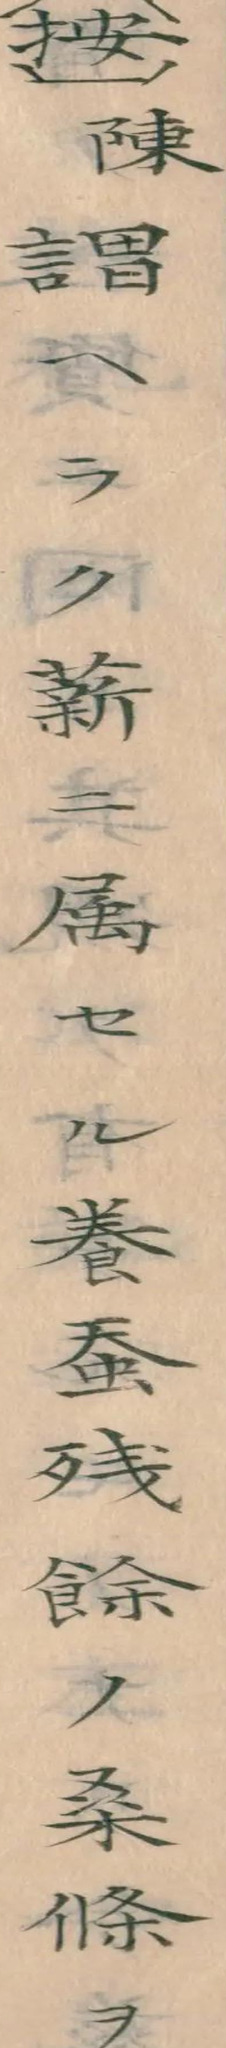[按]陳謂ヘラク薪ニ属セル養蚕残余ノ桑条ヲ
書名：蚕桑集成
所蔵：国立国会図書館 National Diet Library, JAPAN
